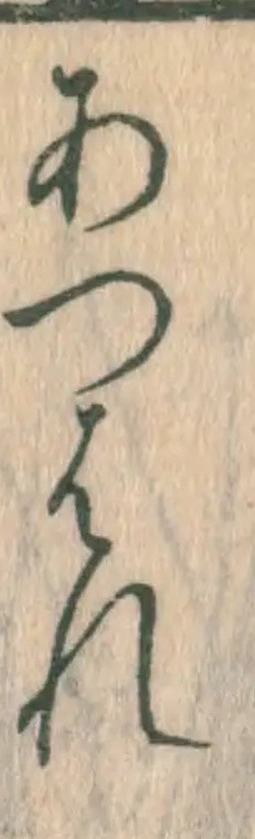あつはれ
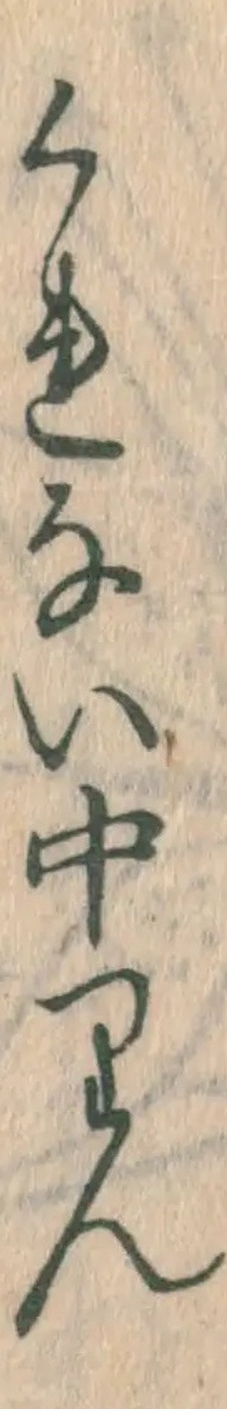くれない中りん
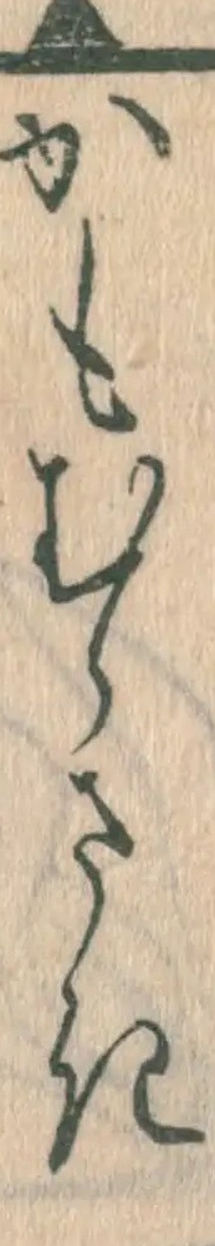▲かもむらさき
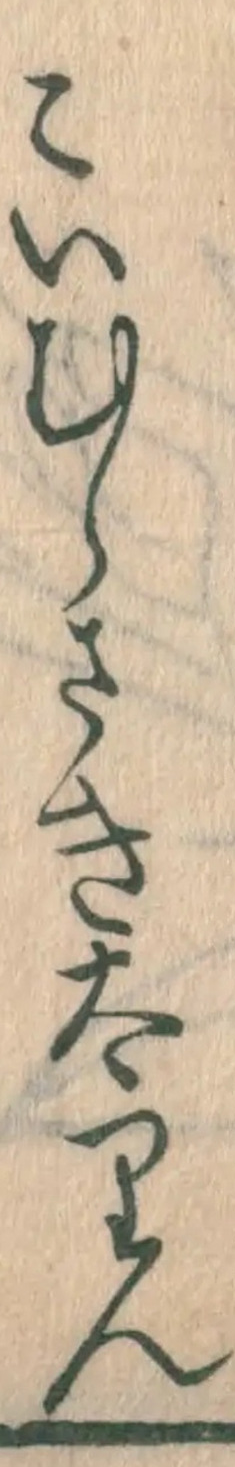こいむらさき太りん

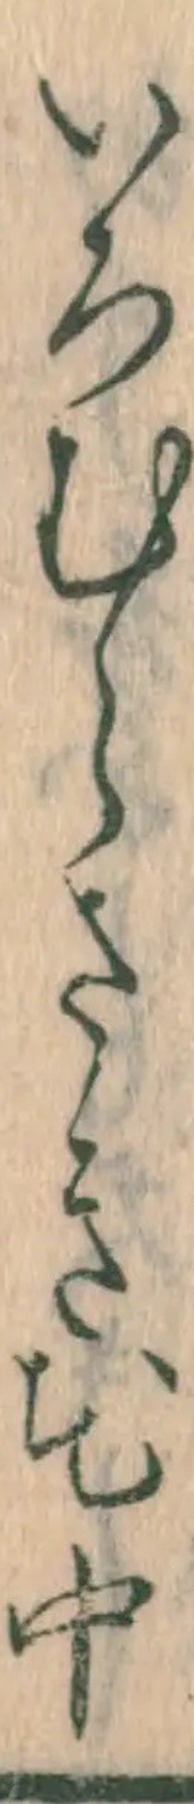いろむらさき花中
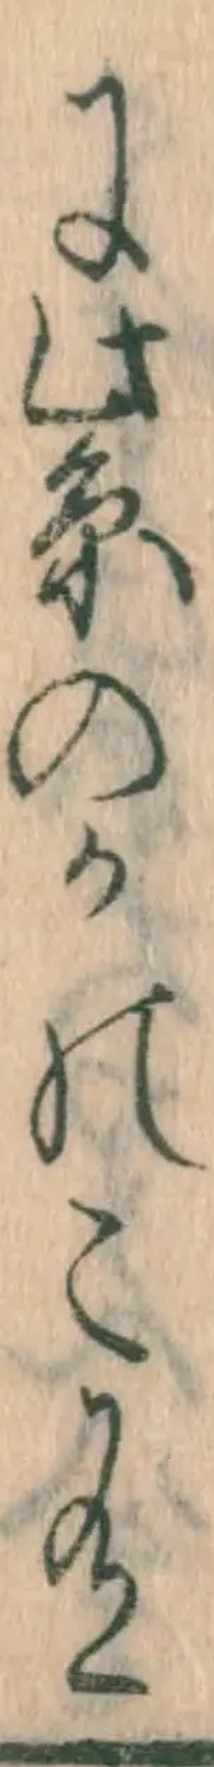に紫のかのこ有
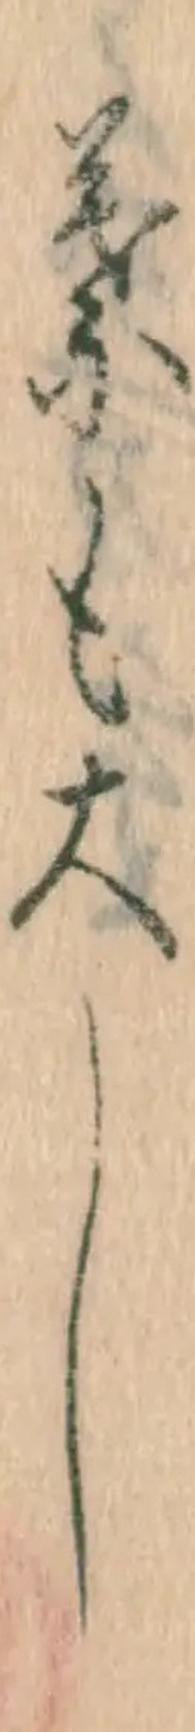葉も大し
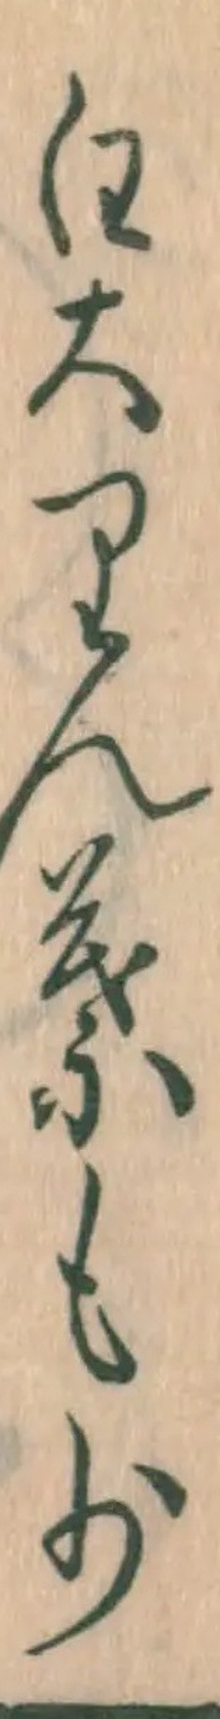白大りん葉も少
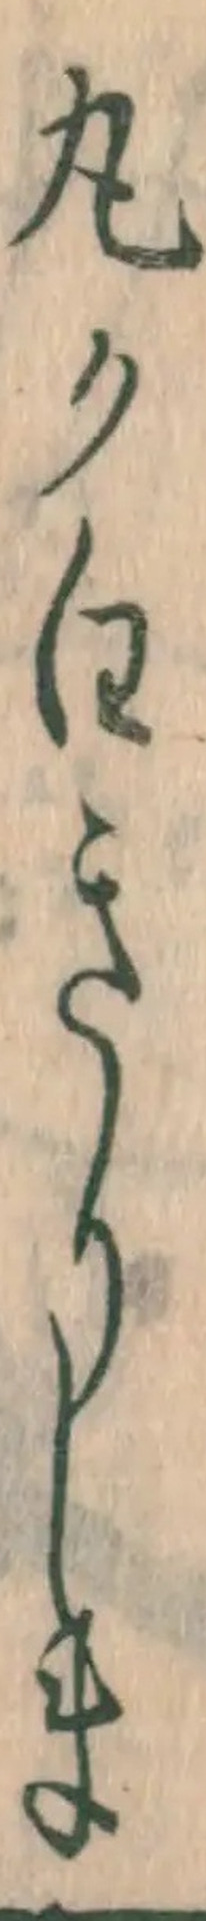丸く白きりしま
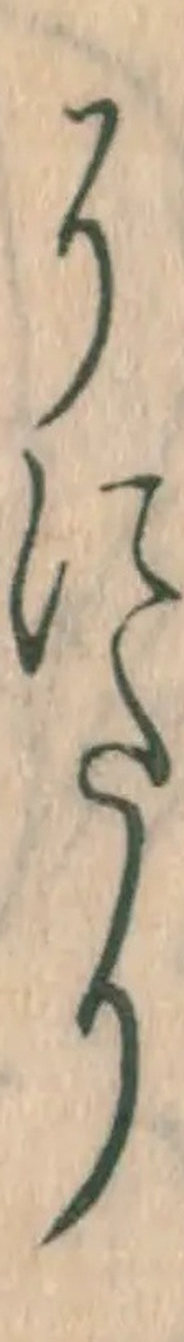ににたり
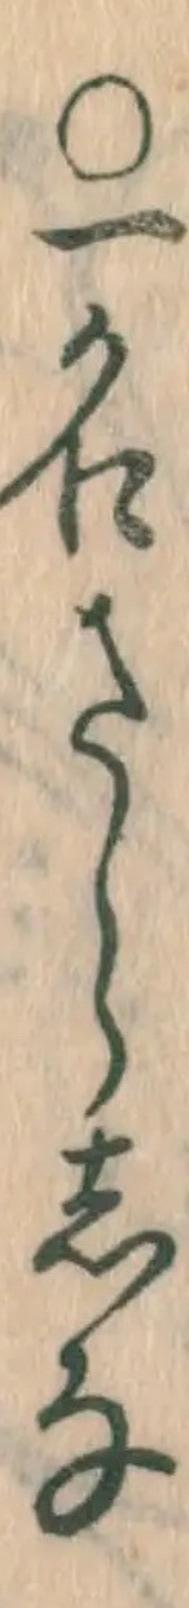○一名さらしな
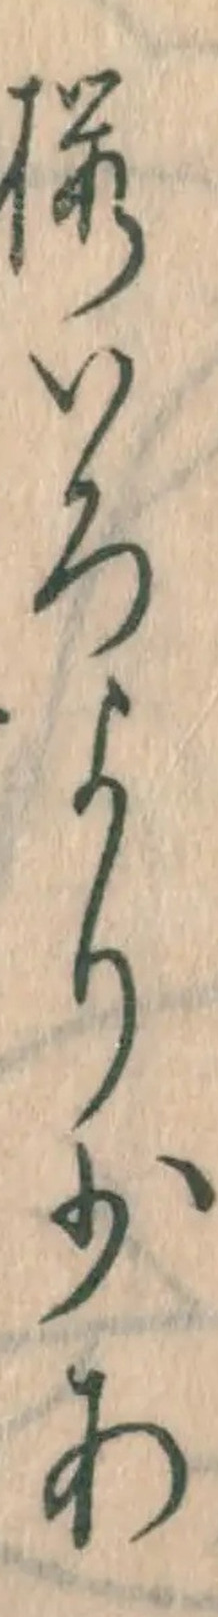桜いろより少あ
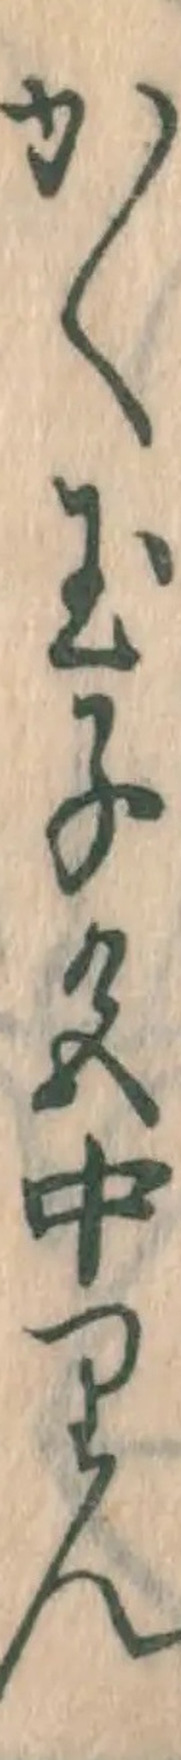かく玉子色中りん

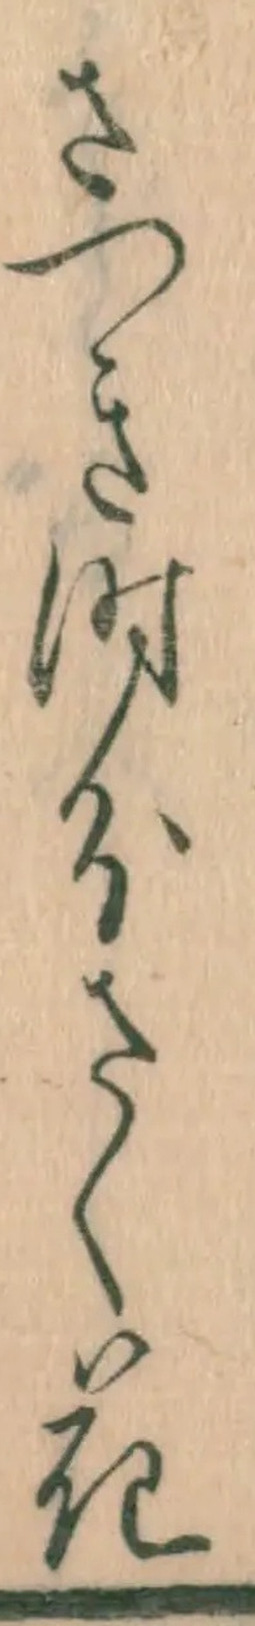さつき時分さく花
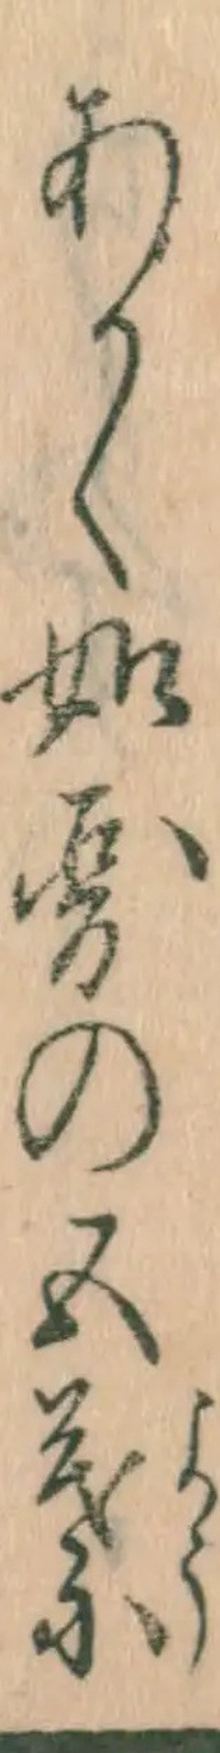あかく如図の五葉
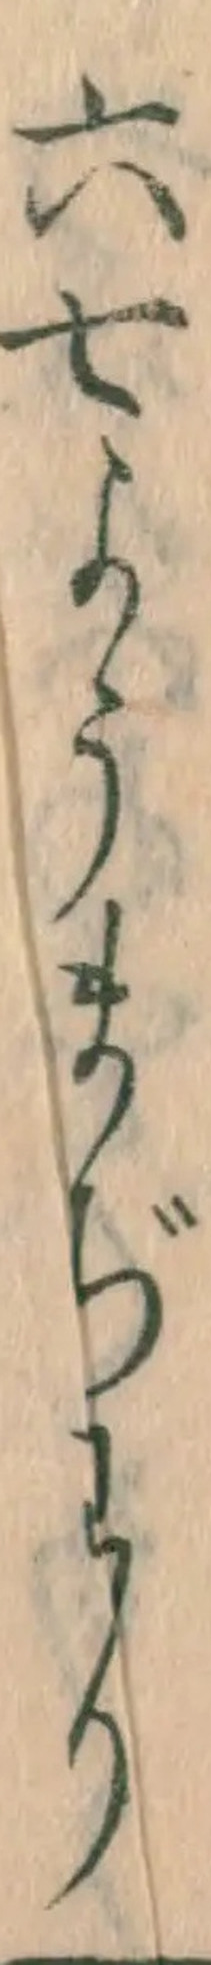六七ようまぢわり
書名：錦繍枕 5巻. [3]
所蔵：国立国会図書館 National Diet Library, JAPAN
